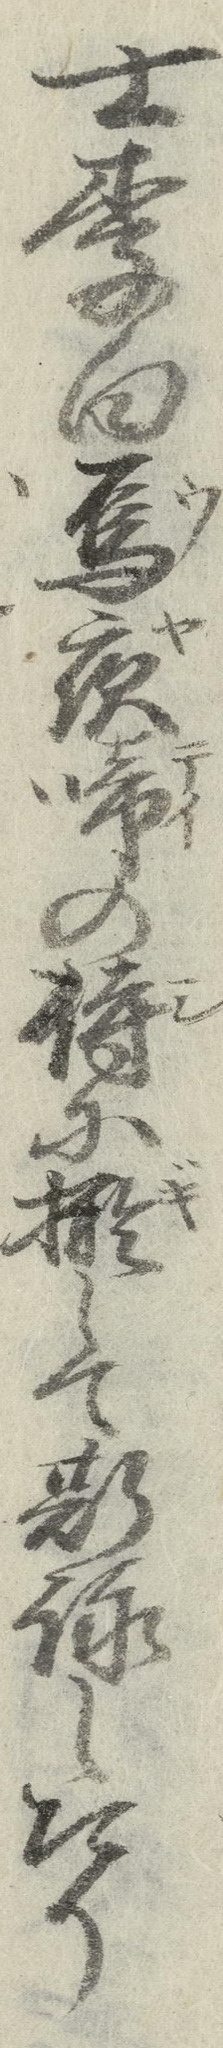士李白烏夜啼の侍に擬して斯祢したり
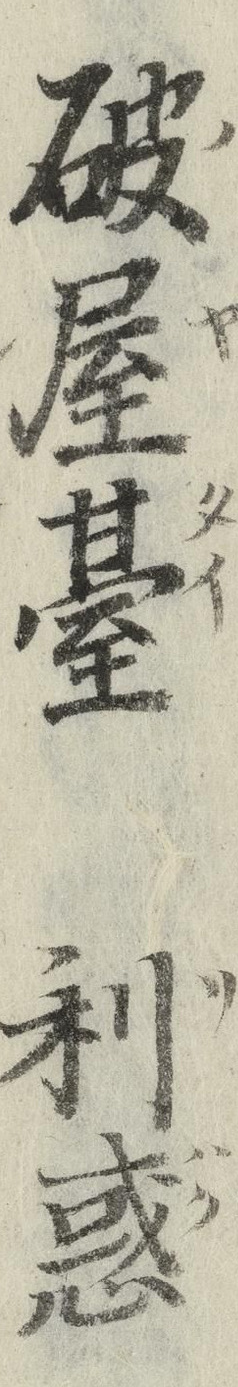破屋臺利惑
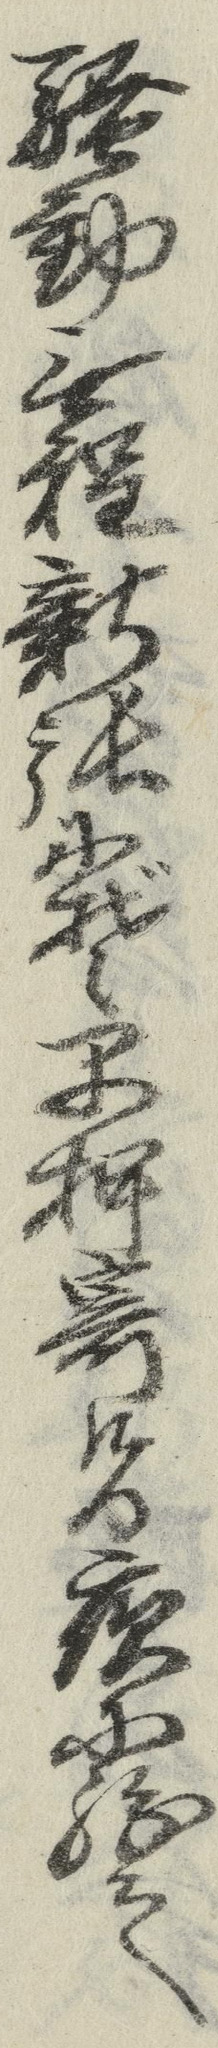騒動無程新張にぞ早押寄ける夜に紛て
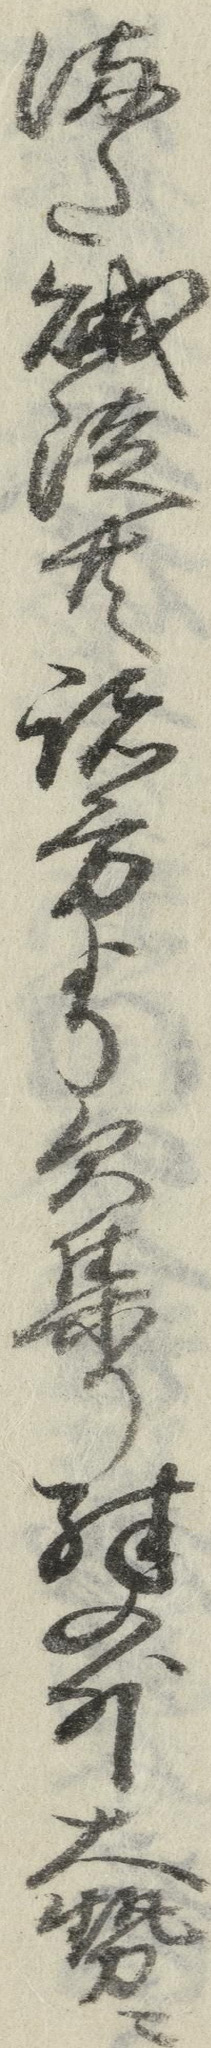また賊徒共諸方より欠集り殊の外大勢に
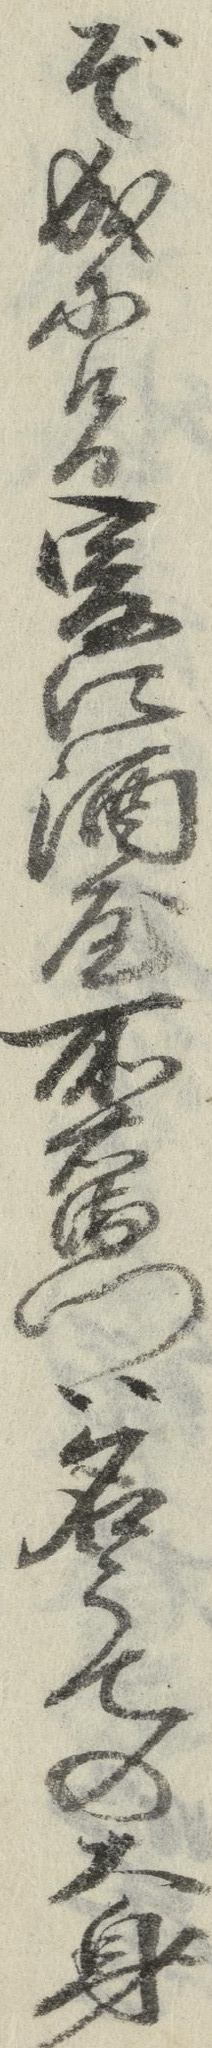ぞ成にける爰に酒屋所右衛門は名うての大身
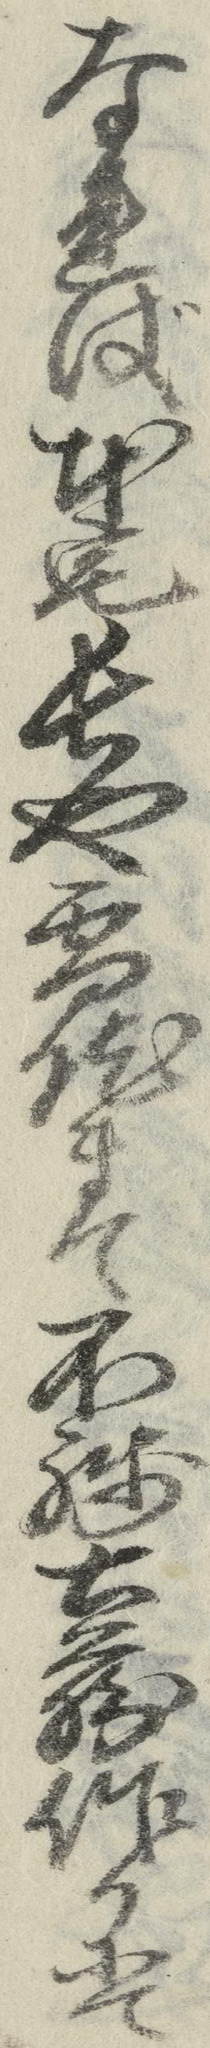なれば本宅長や雪沈まて不残土蔵作りにて
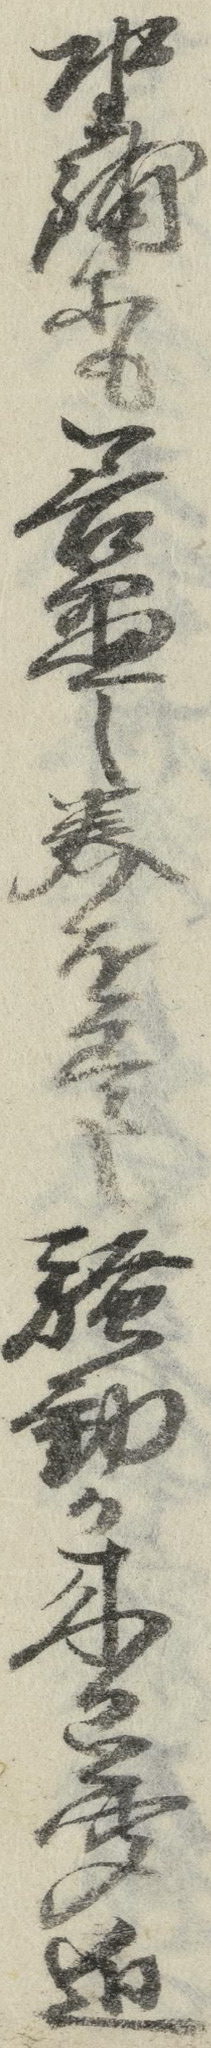座敷にも善尽し美を尽し騒動か来ると聞近
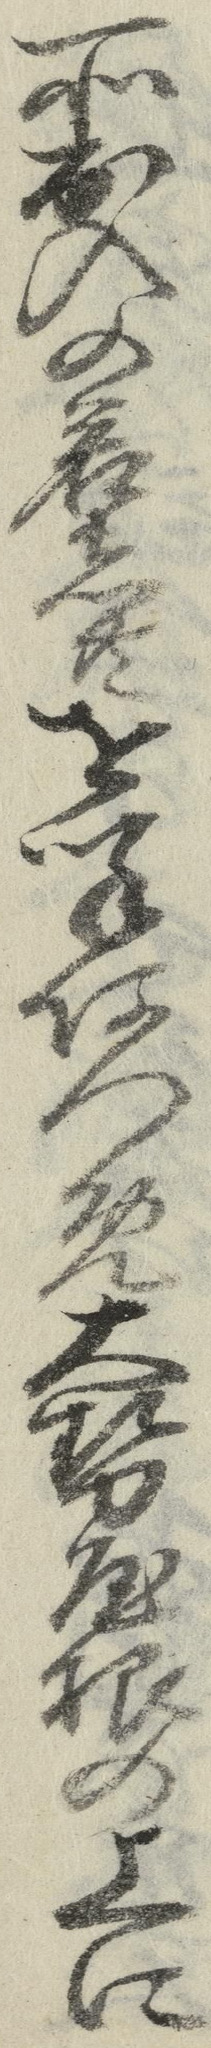所出入の若者共を呼あつめ大勢屋根の上に

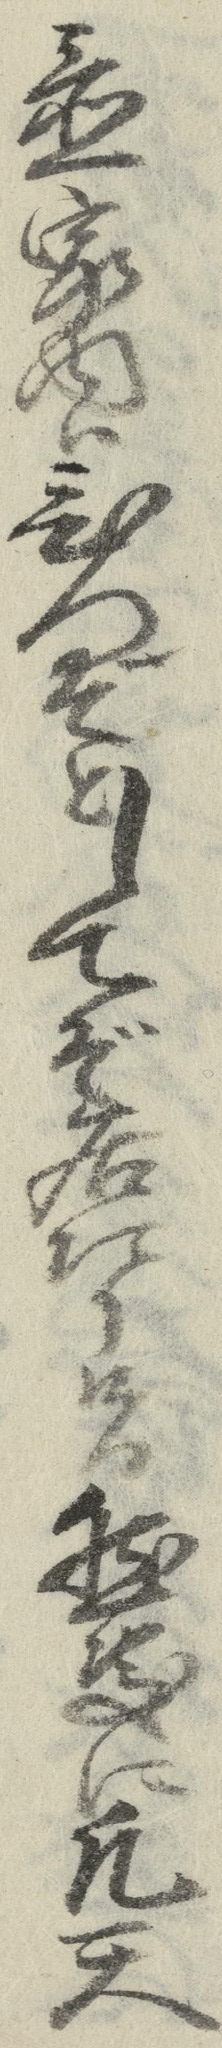置家内はひつそとしてぞ居たりける然処に凡天
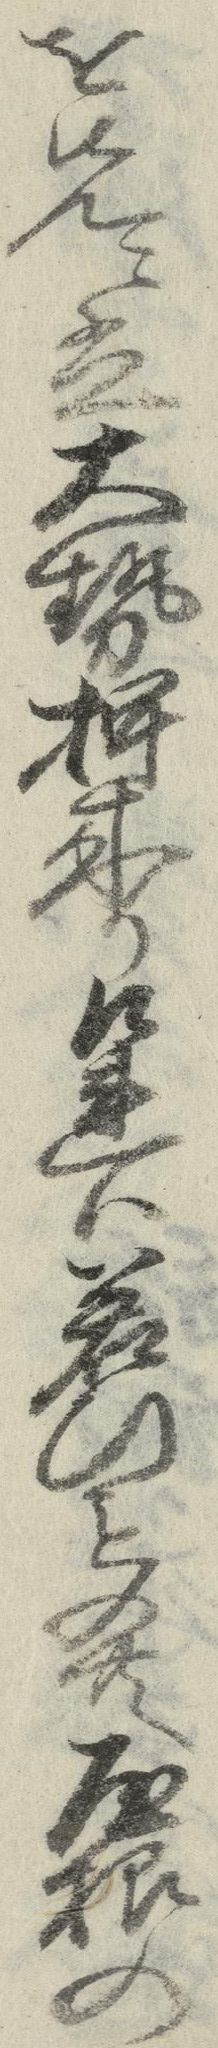を先に立大勢押来りけれは若ひもの共屋根の
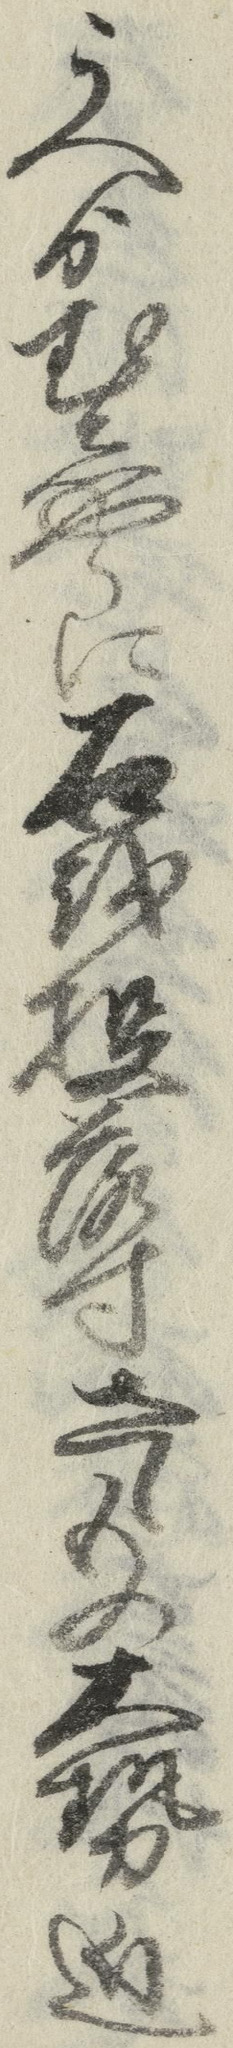うへゟむしやりに石を投落すさしもの大勢近
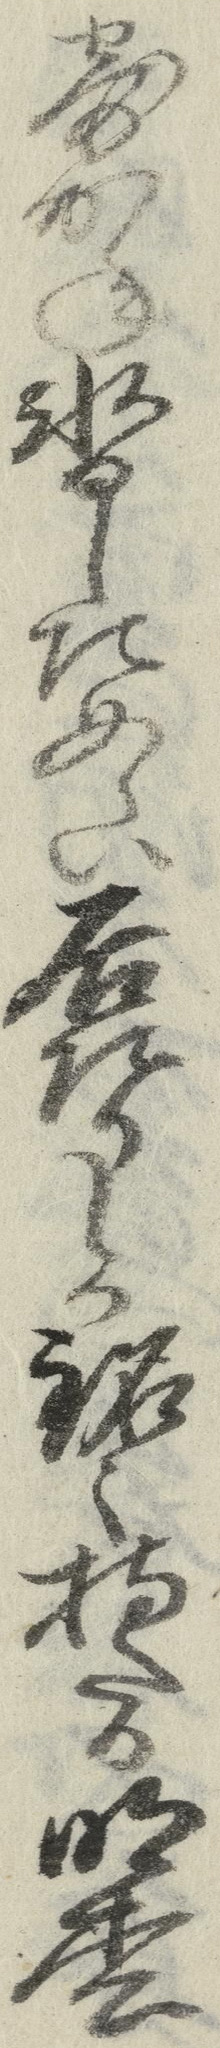寄かね暫しためらい居たりしか銘々持たる明枩
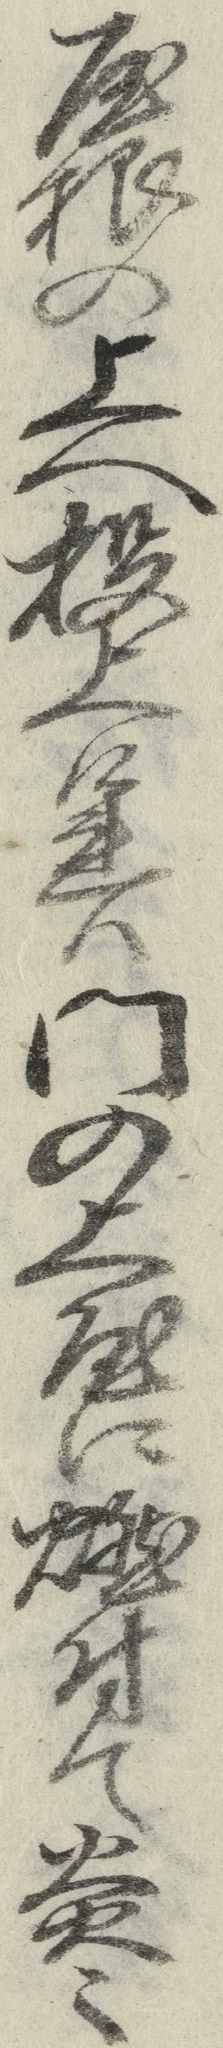屋根の上へ投上けれは門の上屋に燃付て炎々
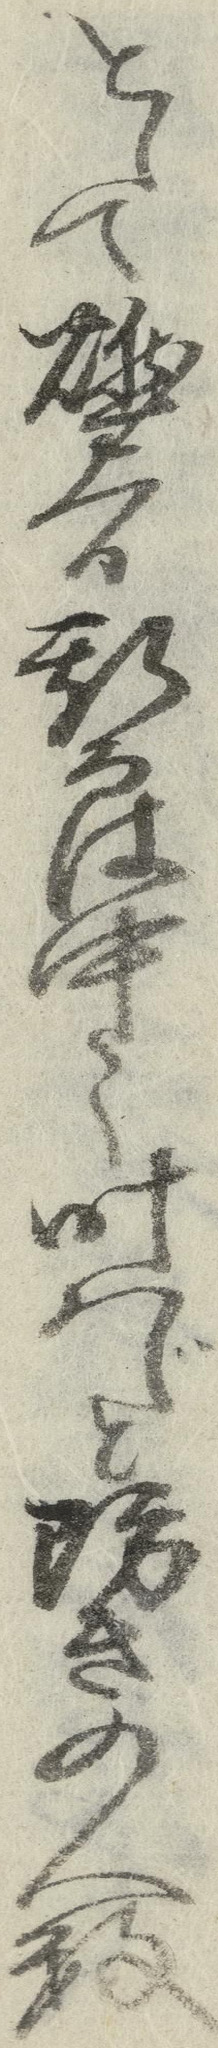として燃上る斯而は中々叶はじと防きの人数
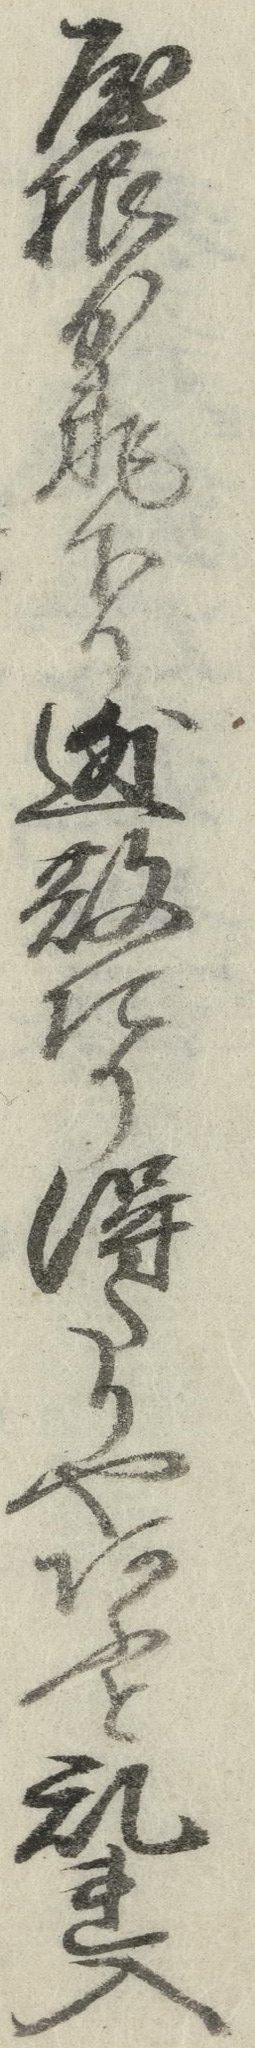屋根ゟ飛下り迯散たり得たりやあふと乱れ入
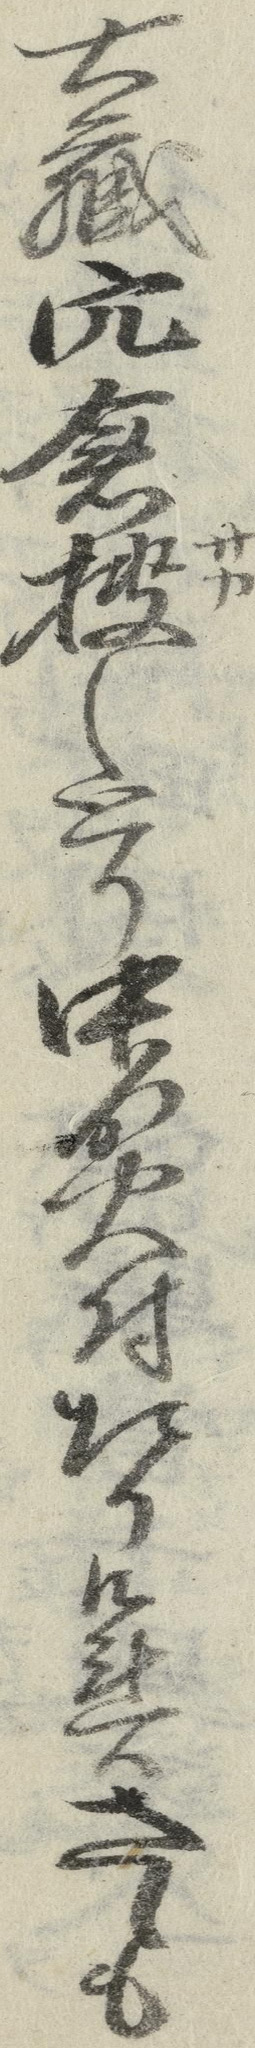土蔵穴倉-捜しとり中ゟ火付たりけれはさしも
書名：浅間大焼騒動記　下
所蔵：東京大学地震研究所図書室 Earthquake Research Institute Library, The University of Tokyo, JAPAN
